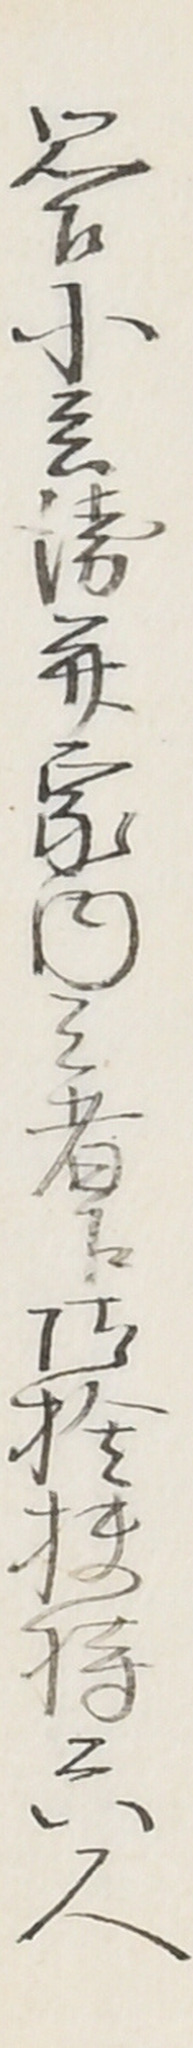思召小兵衛并家内之者江御捨扶持六人
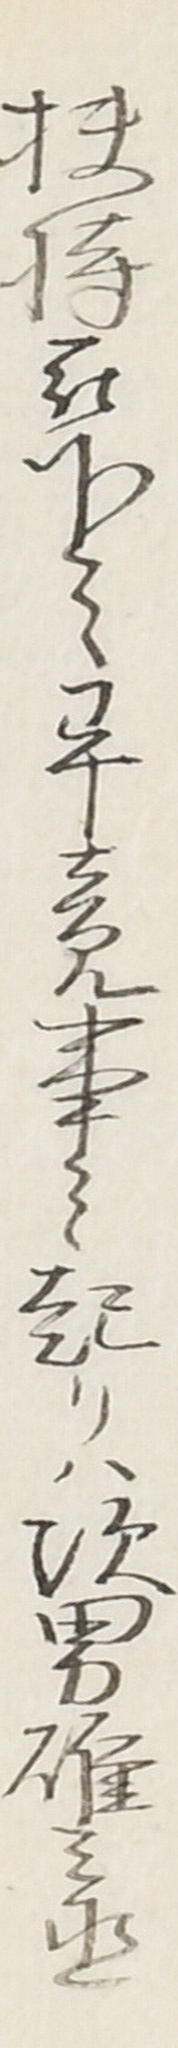扶持被下之畢竟事之起リは次男碓之丞
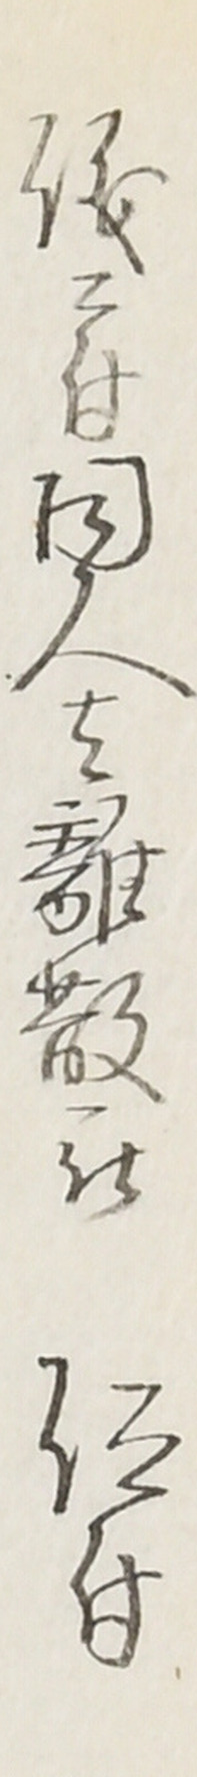儀ニ付同人は離散被仰付
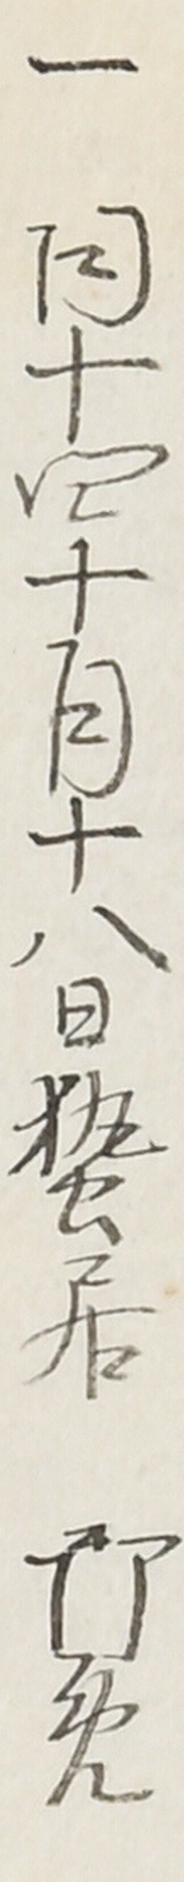一同十四十月十八日蟄居御免
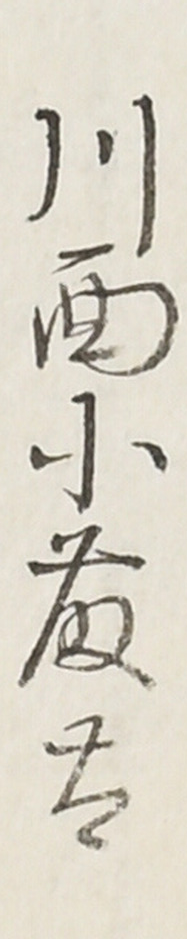川西小藤太
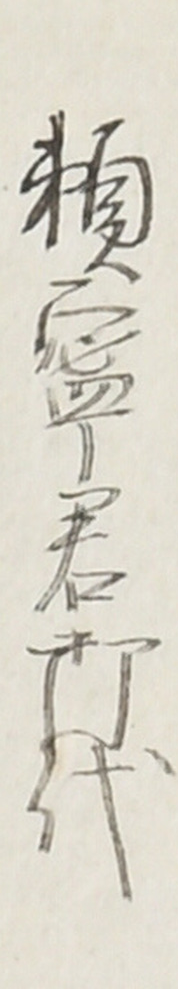頼寧君御代
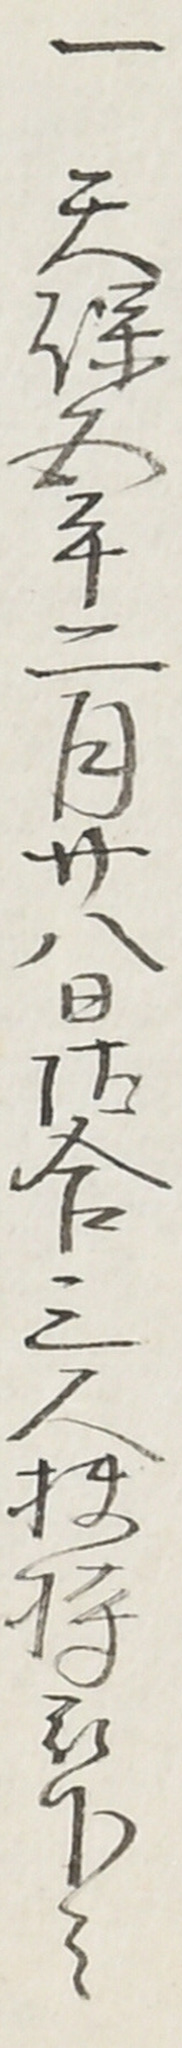一天保五午二月廿八日御合三人扶持被下之
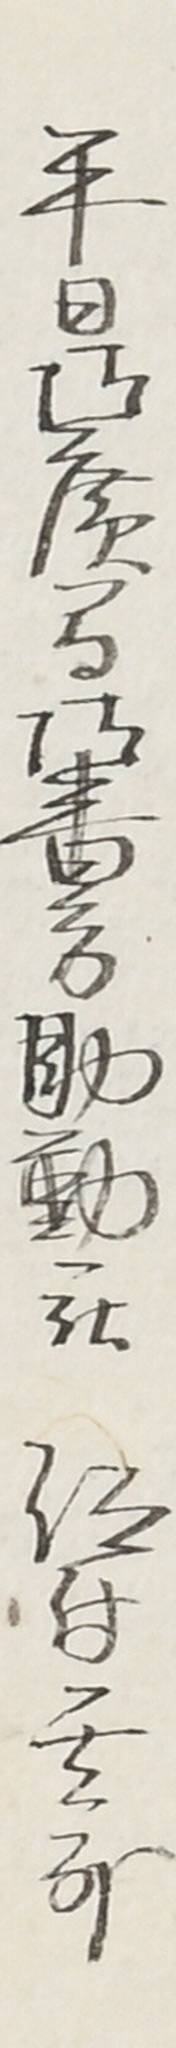平日御広間御番方助勤被仰付其外
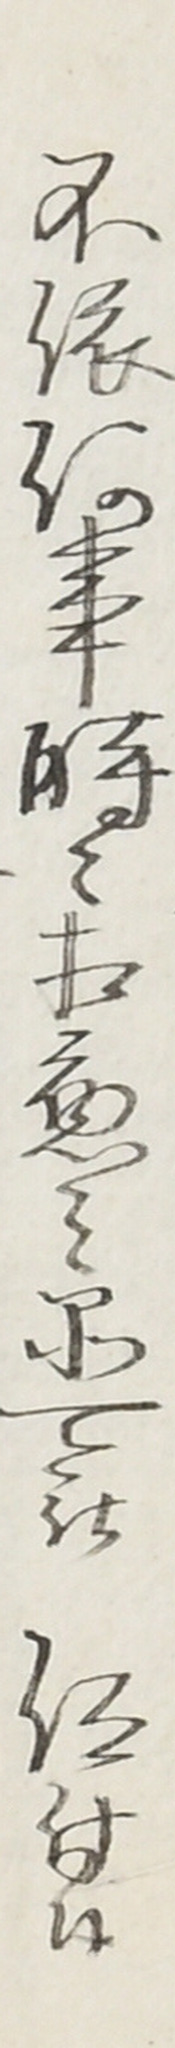不依何事時々相応之品可被仰付候
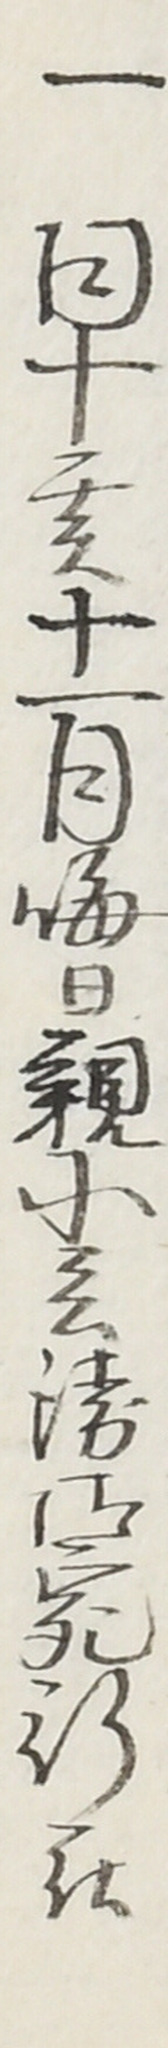一同十亥十一月晦日親小兵衛御宛行被
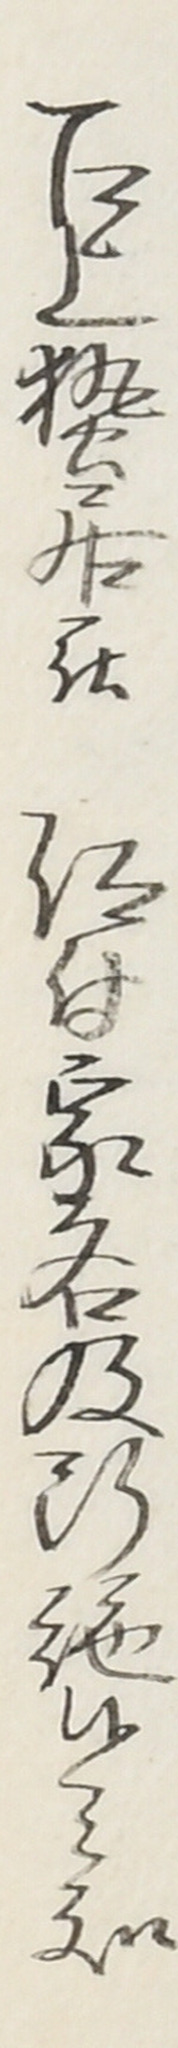召上蟄居被仰付家名及断絶候之処

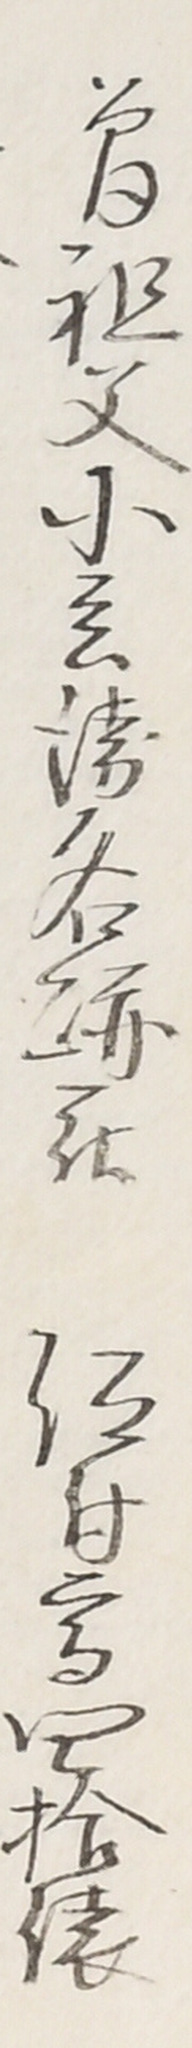曽祖父小兵衛名跡被仰付高四拾俵
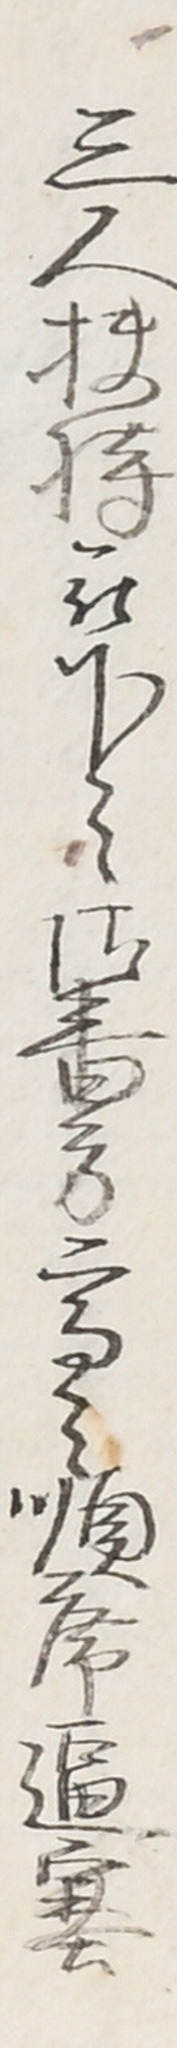三人扶持被下之御番方高之順席逼塞
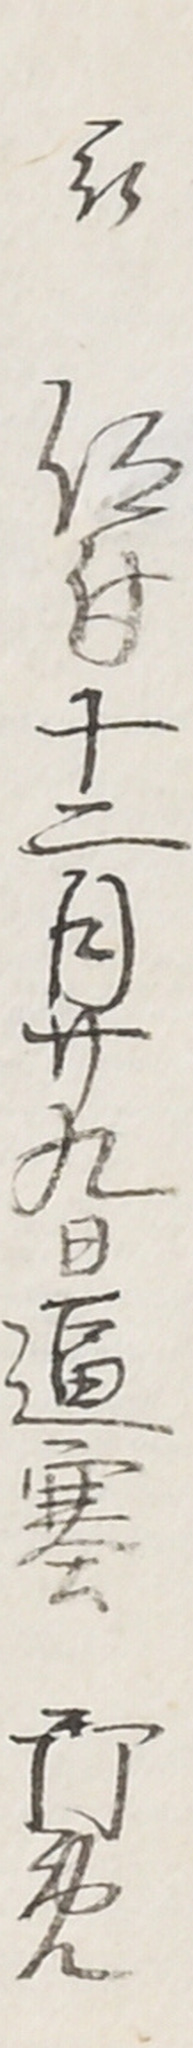被仰付十二月廿九日逼塞御免
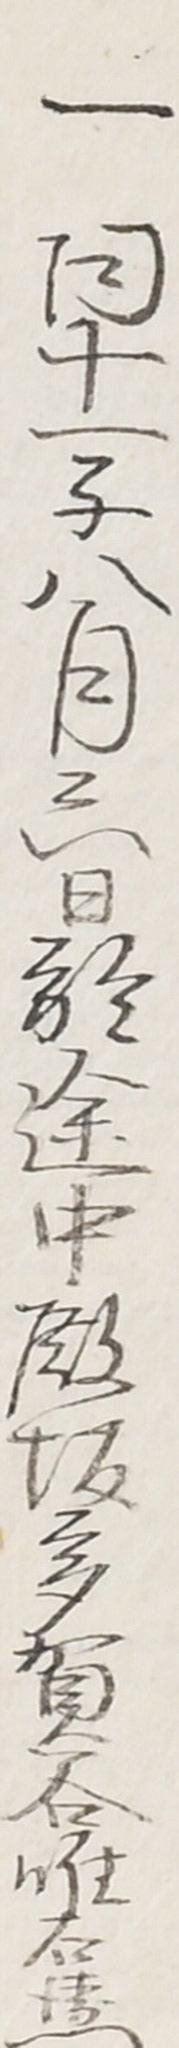一同十一子八月六日於途中殿坂多賀谷唯右衛門ト
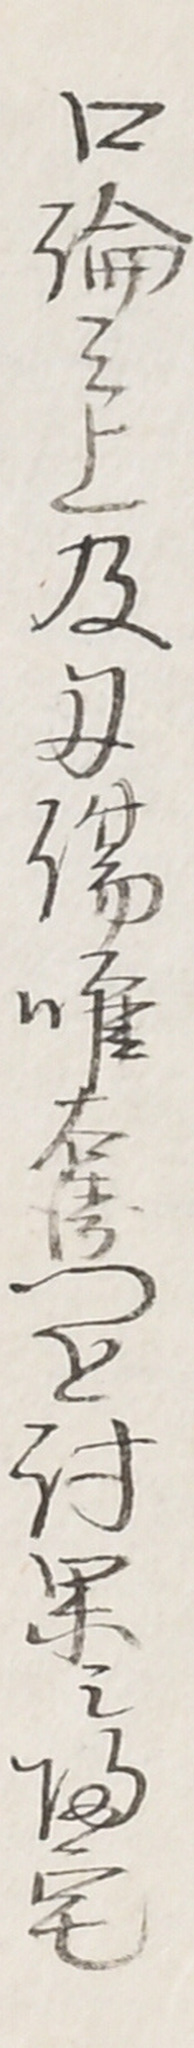口論之上及刃傷唯右衛門を討果シ帰宅
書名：給人諸士勤仕録（七）
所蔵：伊那市立高遠町図書館・合同会社AMANE
